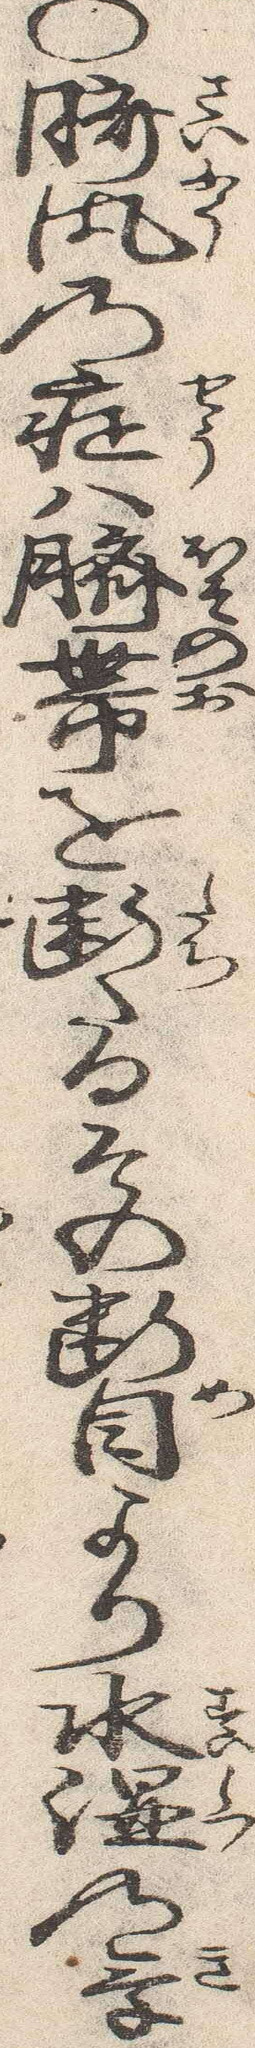○臍風の症は臍帯を断たるその断目より水湿の気
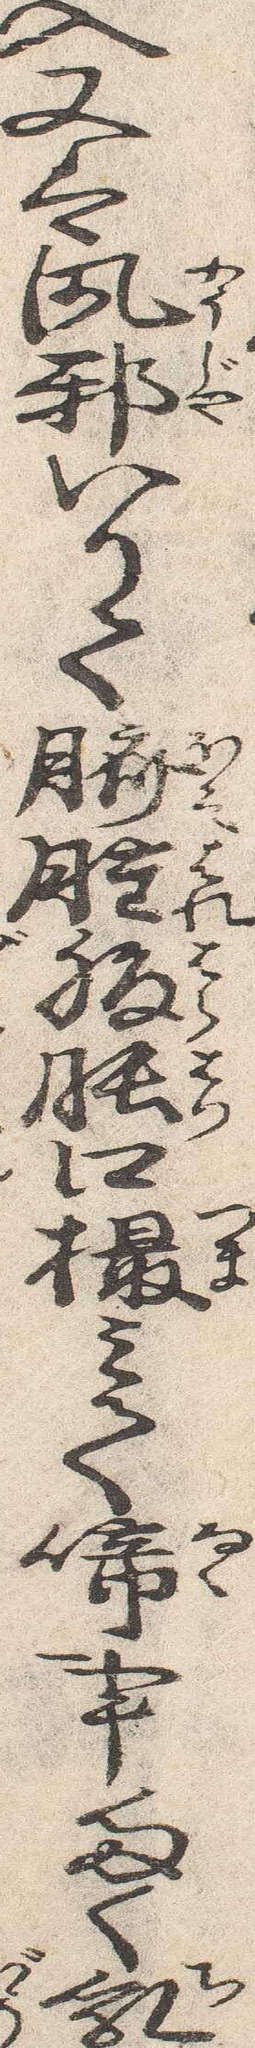入又は風邪いりて臍腫腹脹口撮みて啼事多く乳
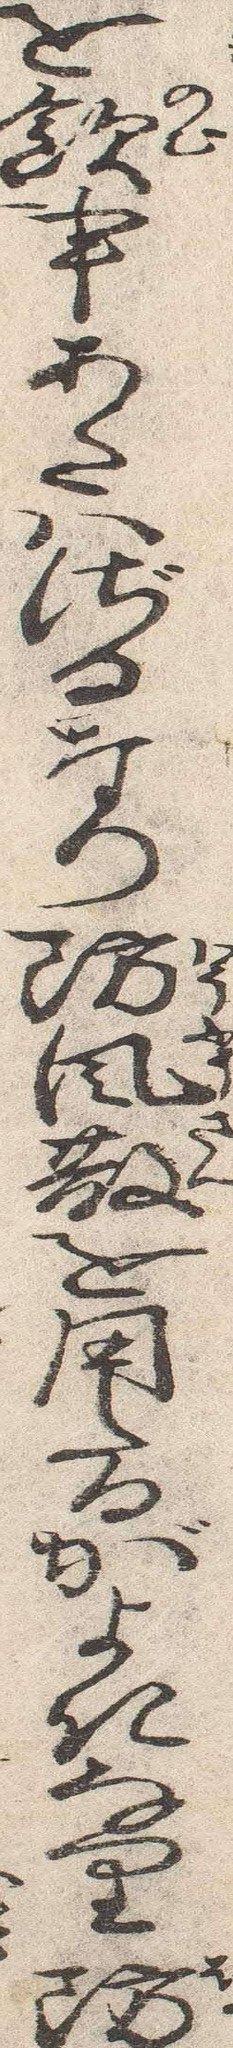を飲事あたはざるなり防風散を用たるがよきなり防
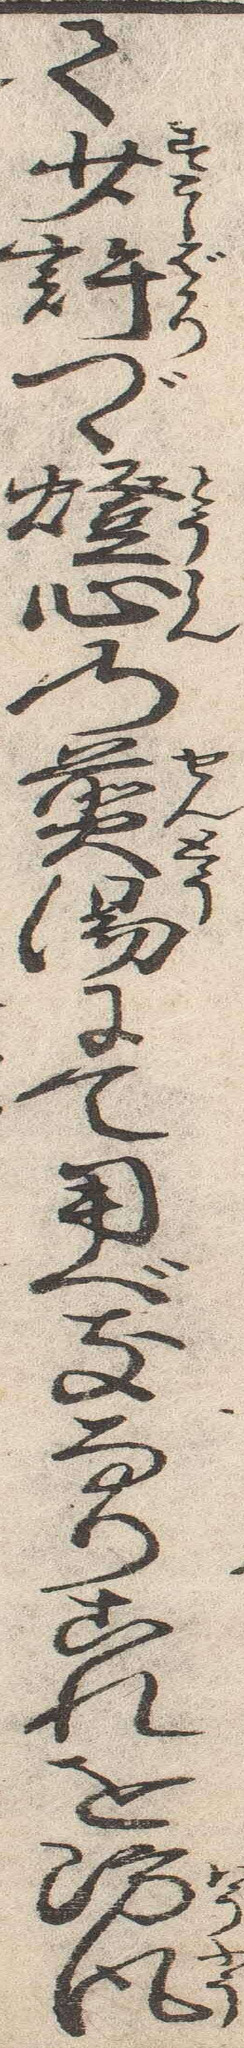て少許づゝ灯心の煎湯にて用べきなりこれを防風
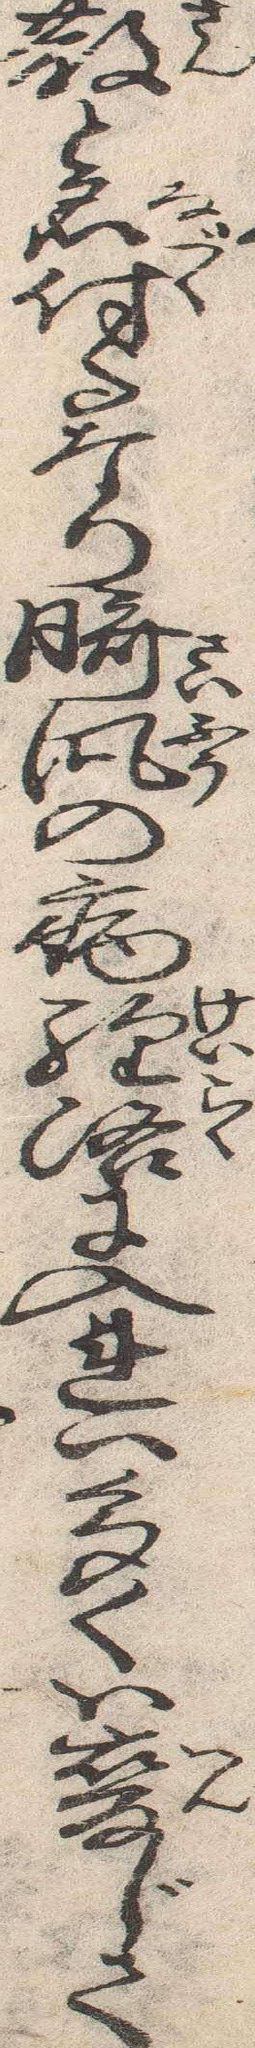散と名付るなり臍風の病経絡に入れは多くは変じて
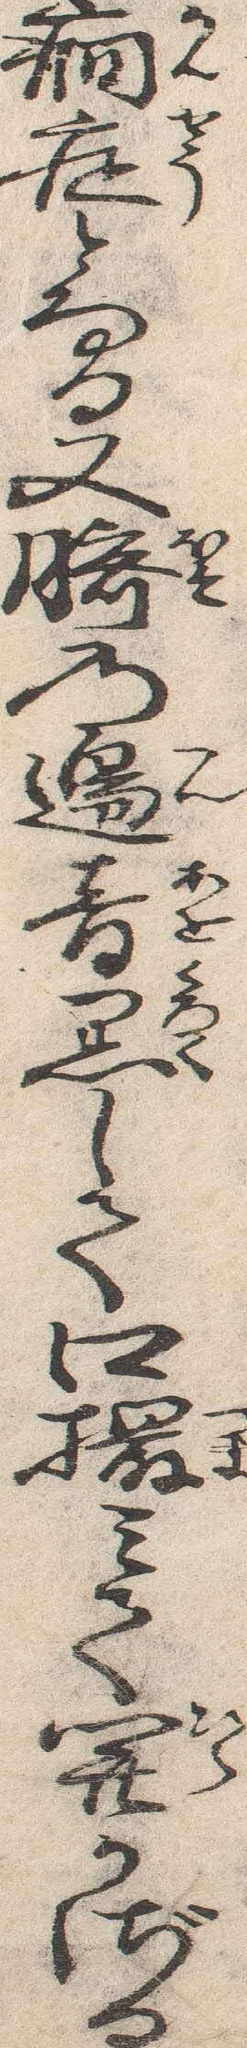癇症となる又臍の辺青黒して口撮みて開かざる
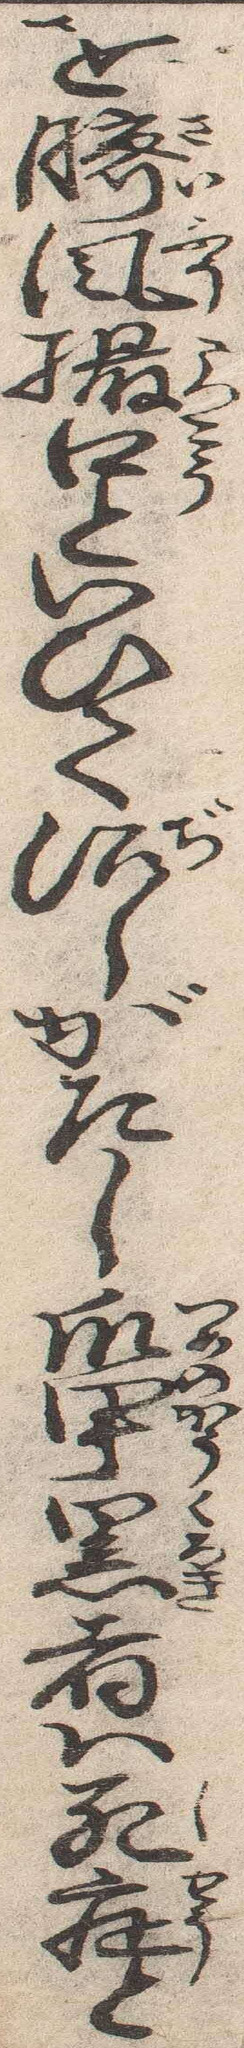を臍風撮口といひて治しがたし爪甲黒者は死症と
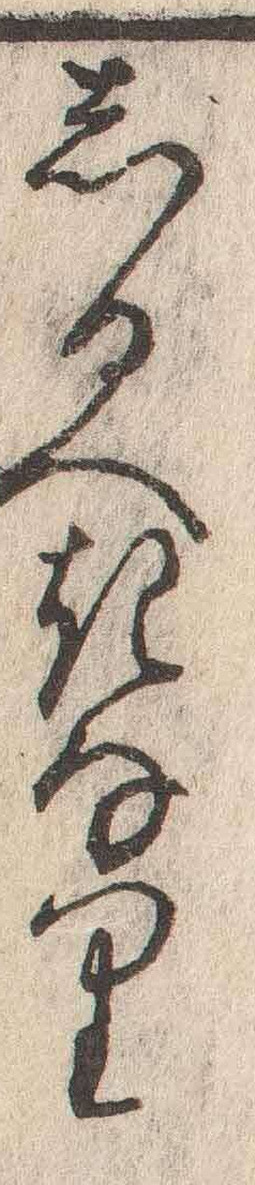しるへきなり

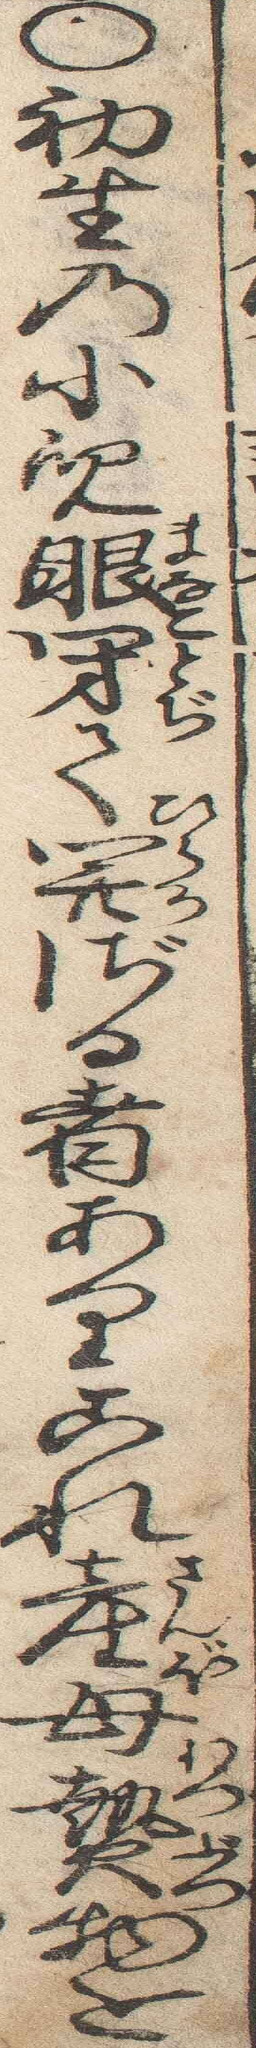○初生の小児眼閉て開ざる者ありこれ産母熱物を
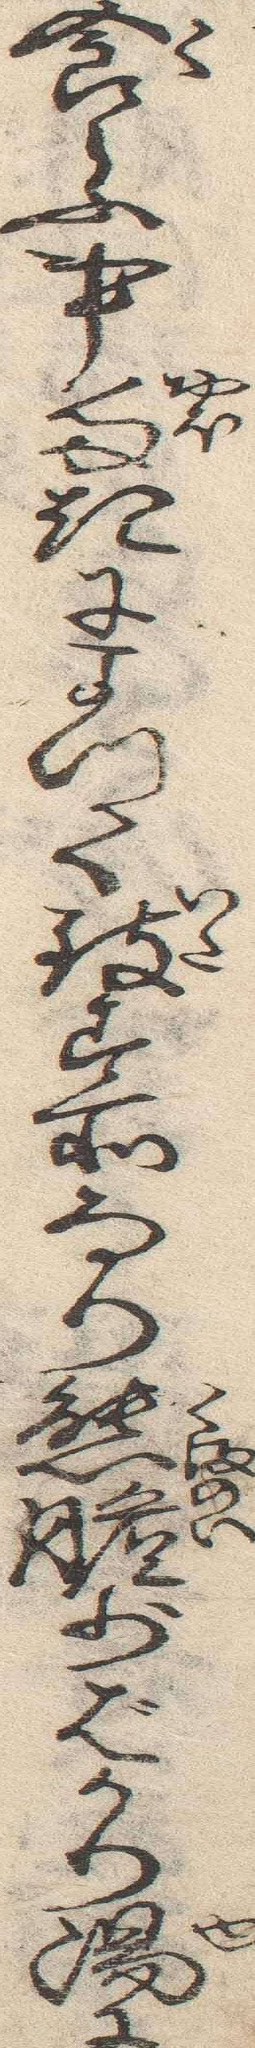食らふ事多きによつて致す所なり熊胆少ばかり湯に
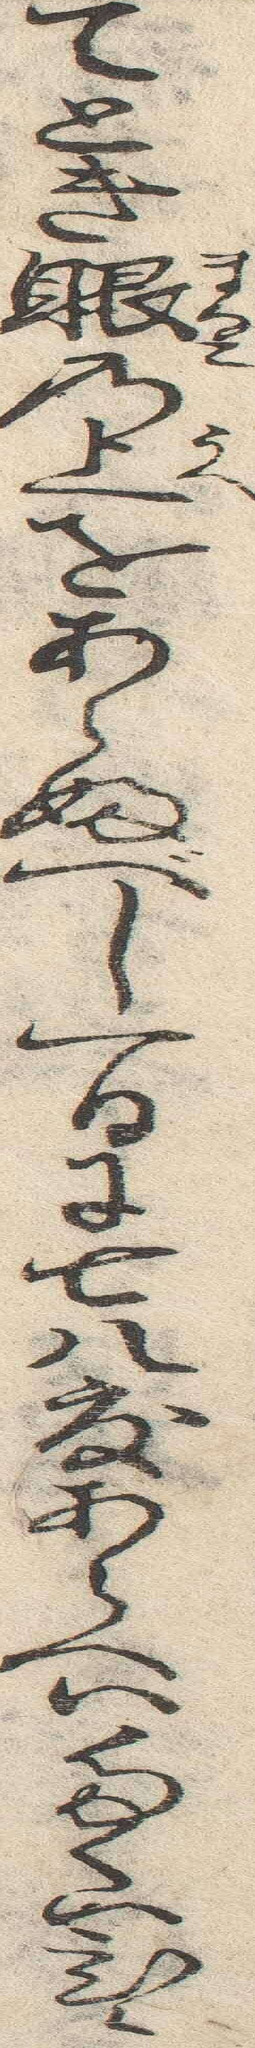てとき眼の上をあらふべし一日に七八度あらへは多くはひゝ
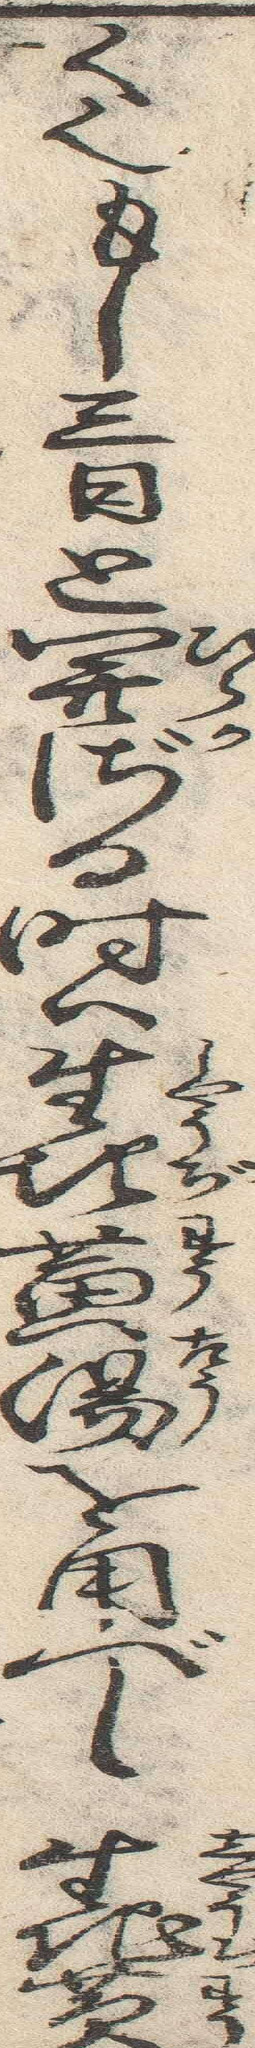く也もし三日と開ざる時は生地黄湯を用べし生地黄
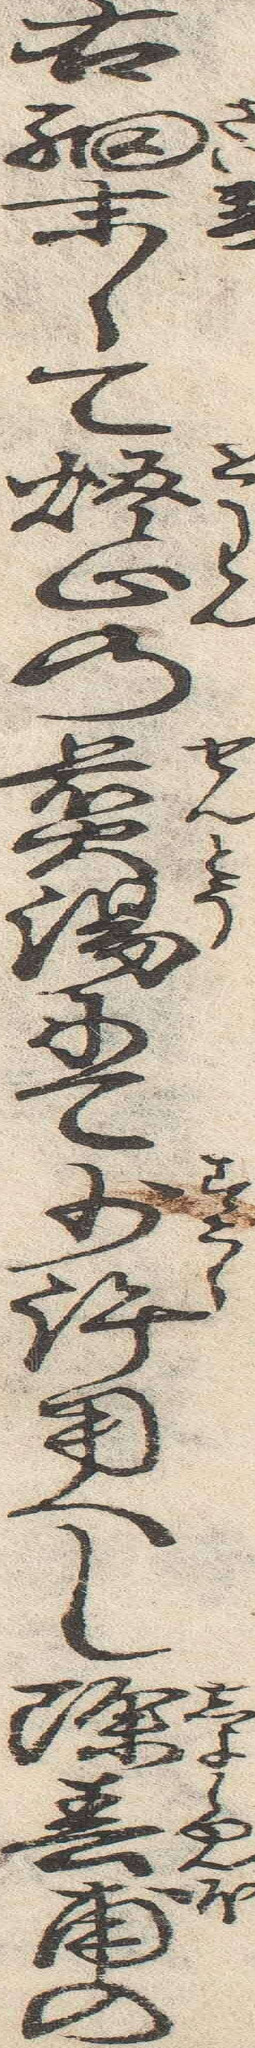右細末して灯心の煎湯にて少許用へし除春甫の
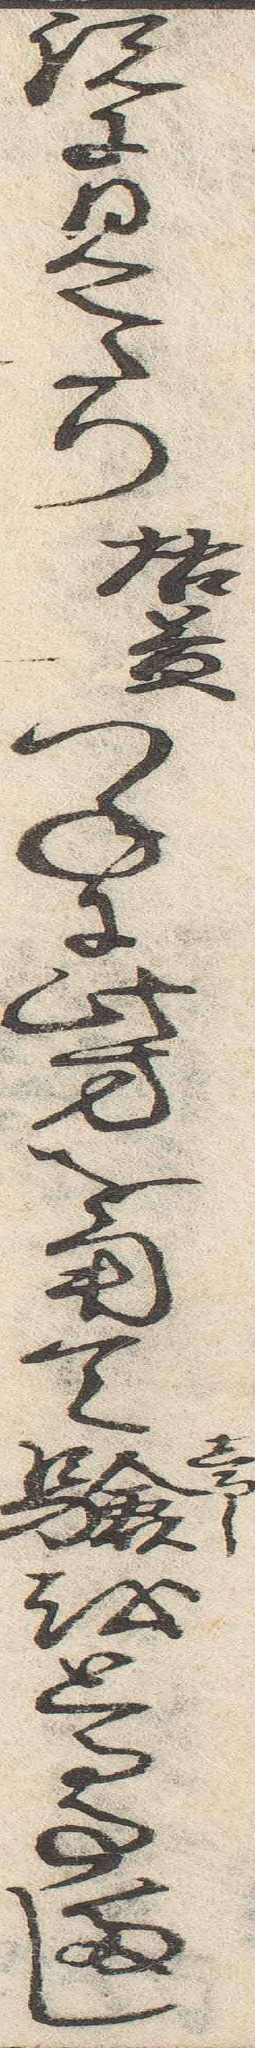説に見えたり啓益つねに此方を用て験をとる事多し
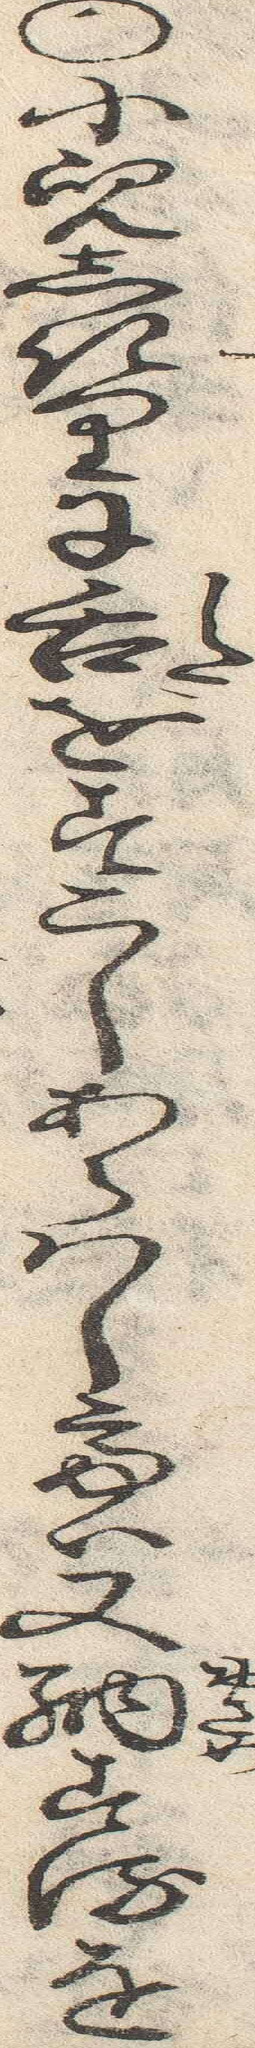○小児しきりに舌をすこしあらはしては又納するを
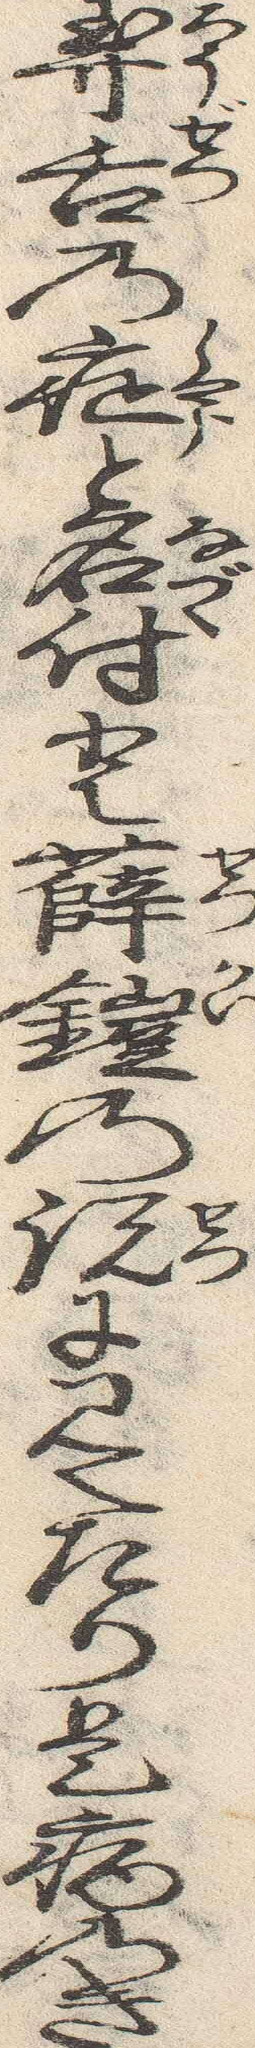弄舌の症と名付と薛鎧の説に見えたり是病のき
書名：小児必用養育草
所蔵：東京学芸大学附属図書館 国文学研究資料館
